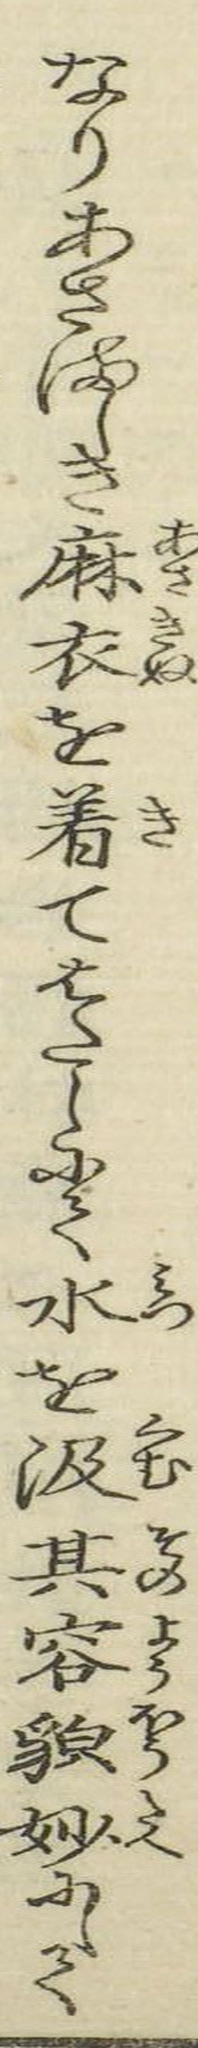なりあさましき麻衣を着てはたしにて水を汲其容貌妙にして
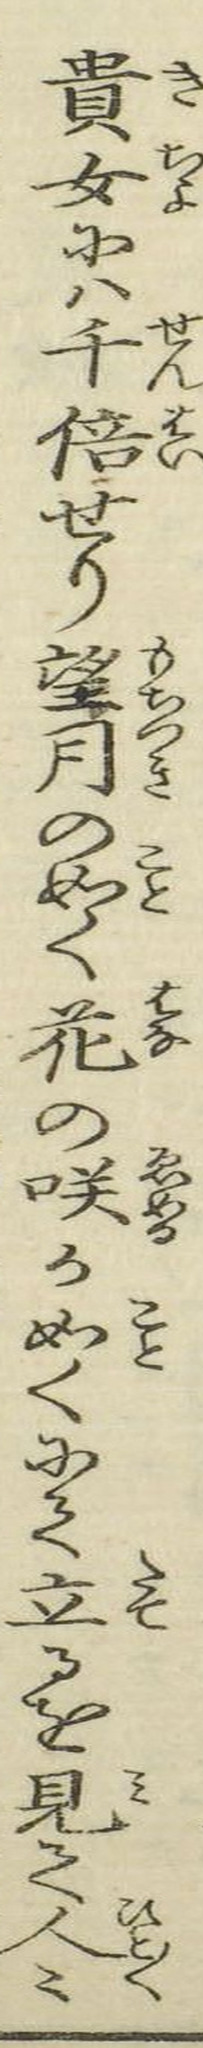貴女には千倍せり望月の如く花の咲か如くにて立るを見て人々
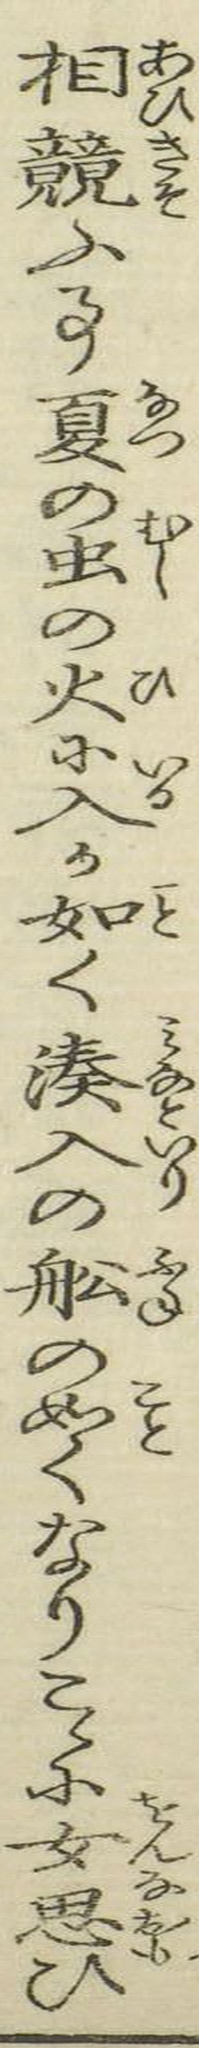相競ふ事夏の虫の火に入か如湊入の船の如くなりこゝに女思ひ
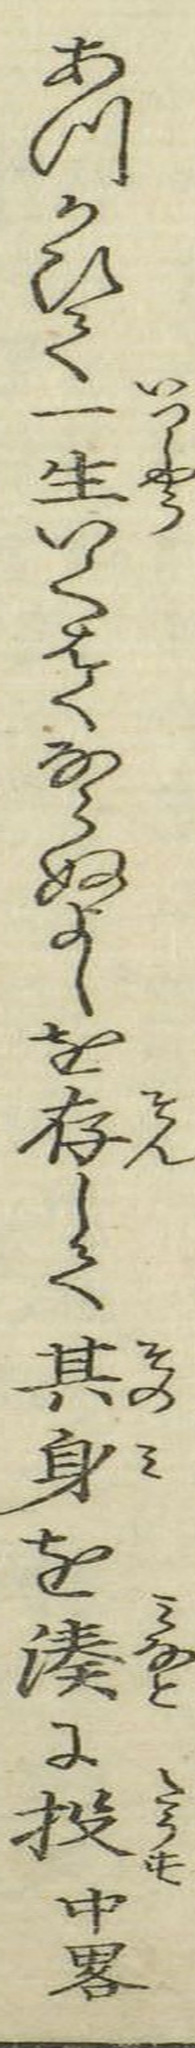あつかひて一生いくはくならぬよしを存して其身を湊に投中略
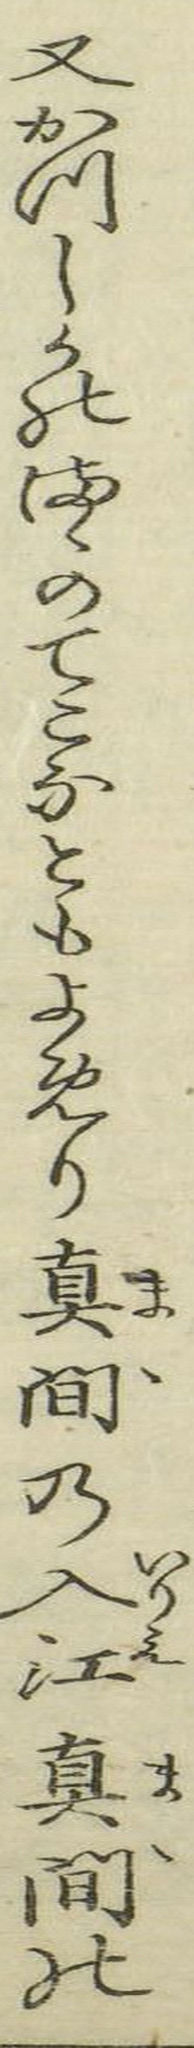又かつしかのまゝのてこなともよめり真間の入江真間の
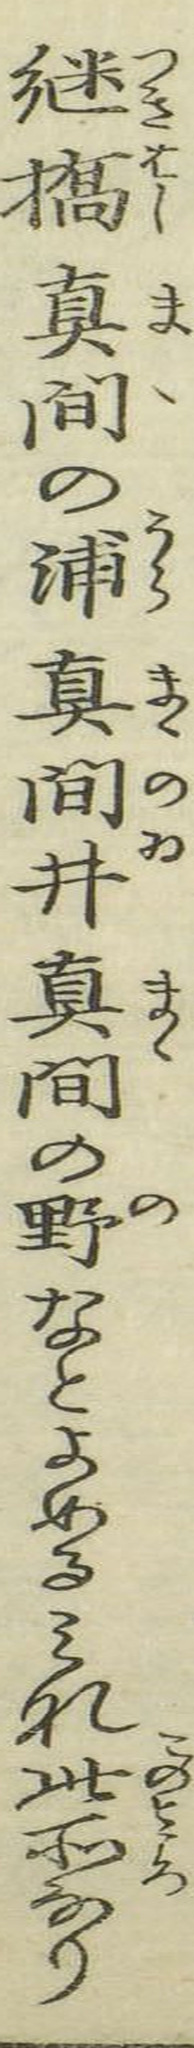継橋真間の浦真間井真間の野なとよめるみな此所なり

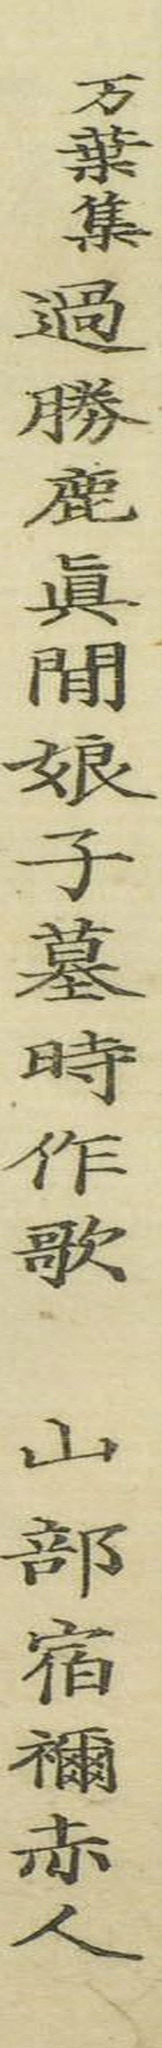万葉集過勝鹿真間娘子墓時作歌山部宿禰赤人
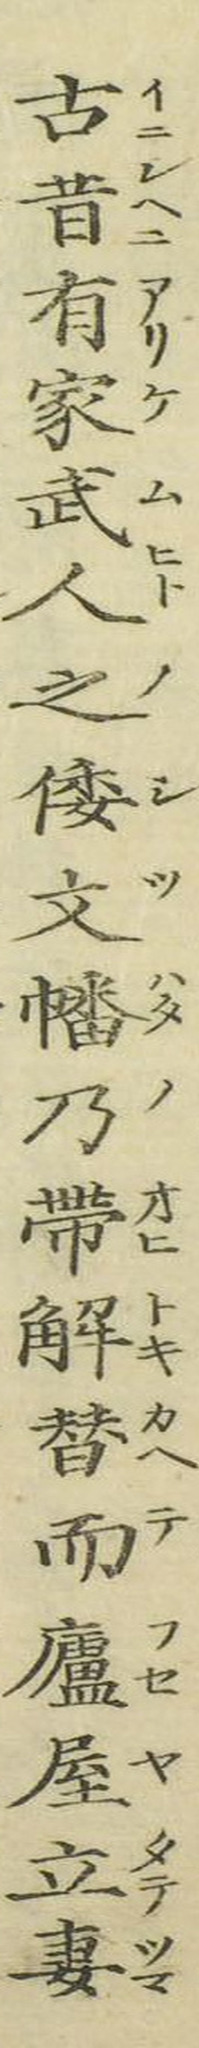古昔有家武人之倭文幡乃帯解替而廬屋立妻
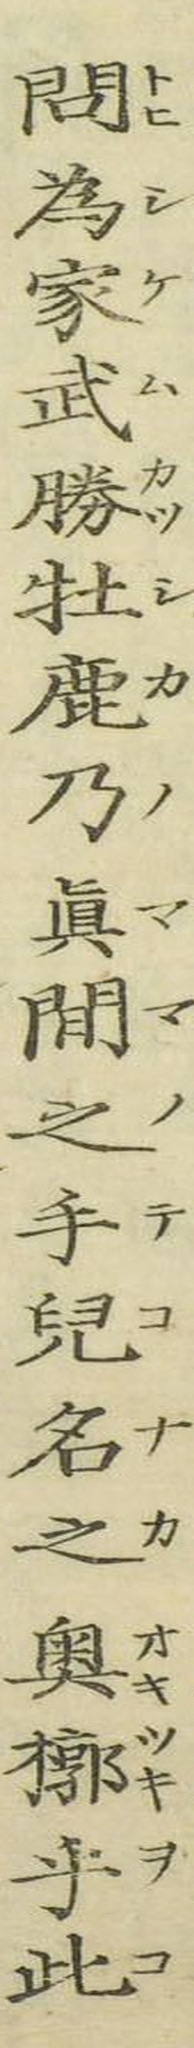問為家武勝牡鹿乃真間之手児名之奥槨乎此
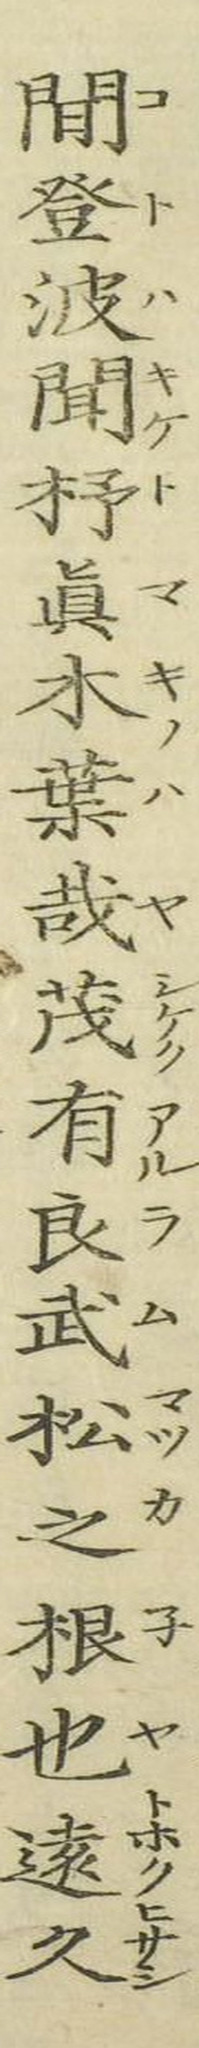間登波聞杼真木葉哉茂有良武松之根也遠久
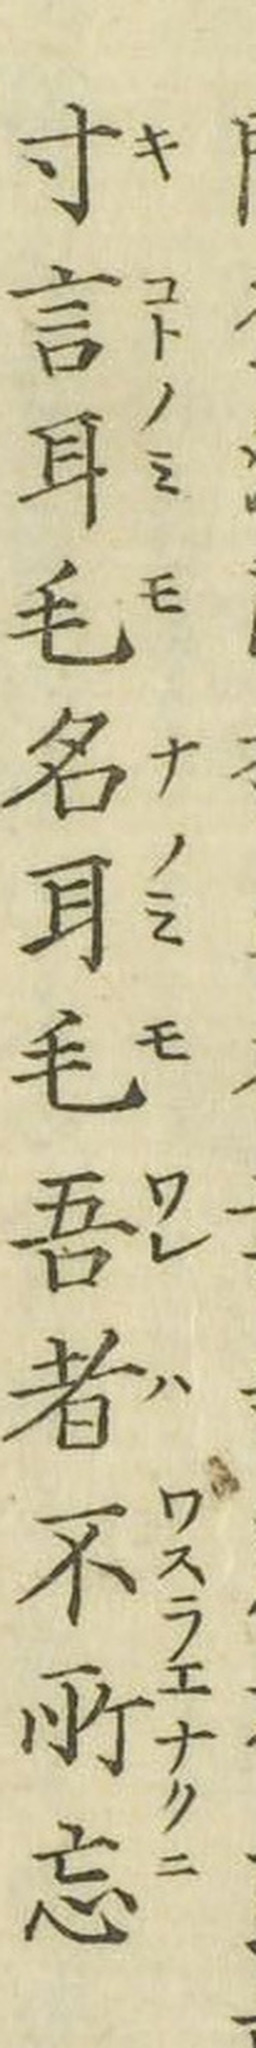寸言耳毛名耳毛我者不所忘
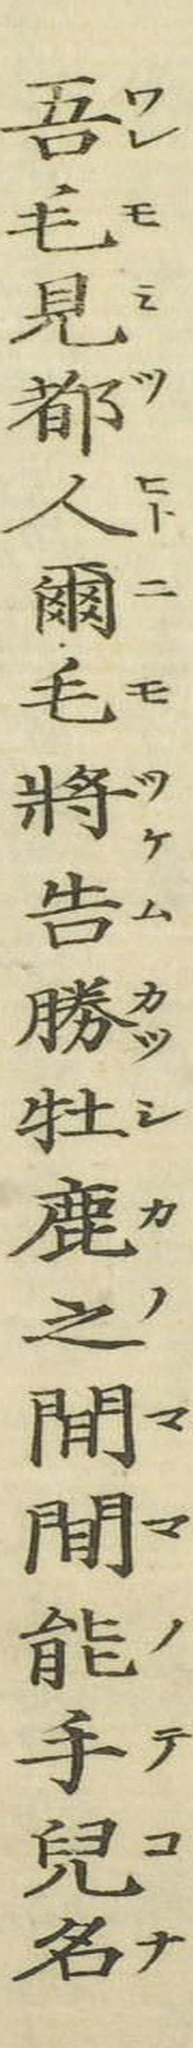吾毛見都人爾毛将告勝牡鹿之間間能手児名
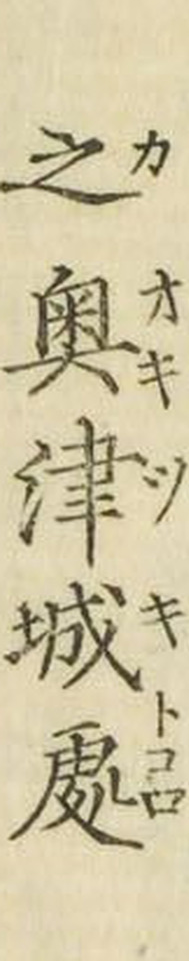之奥津城処
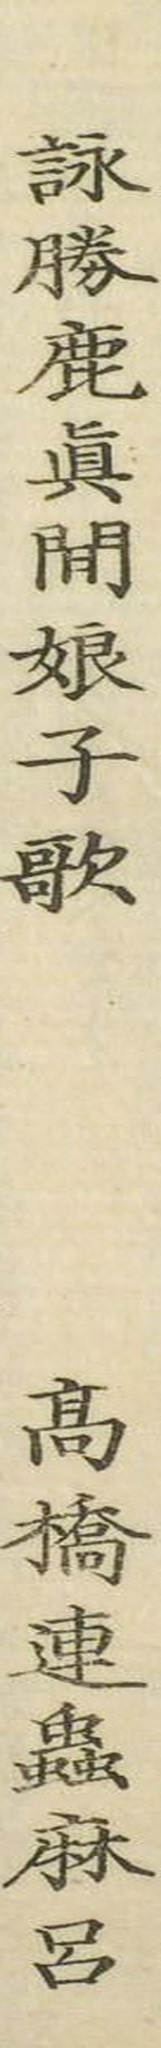詠勝鹿真間娘子歌高橋連虫麻呂
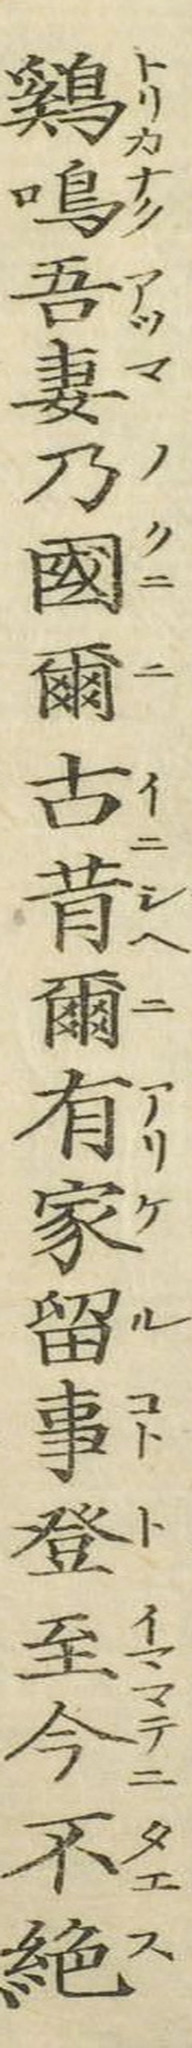鶏鳴吾妻之国爾古昔爾有家留事登至今不絶
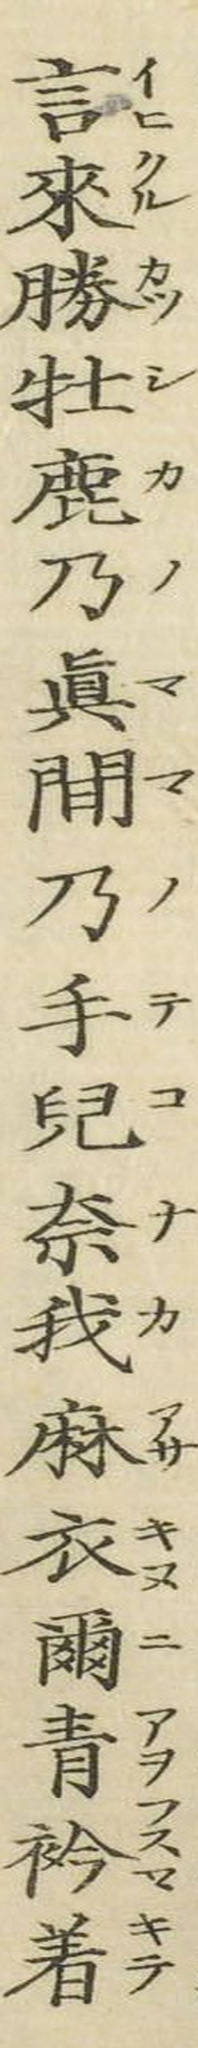言来勝牡鹿之真間乃手児奈我麻衣爾青衿着
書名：江戸名所図会 20巻 巻之20
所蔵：東京学芸大学教育コンテンツアーカイブ
